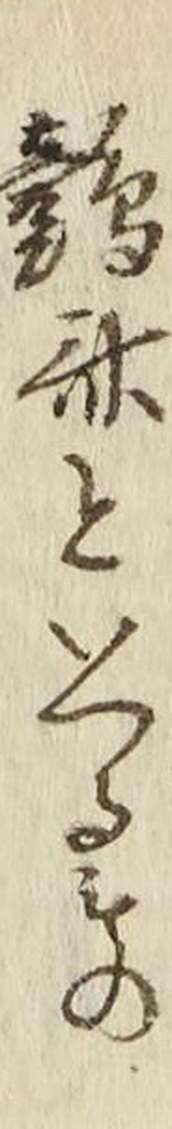鶏？斎といへるもの
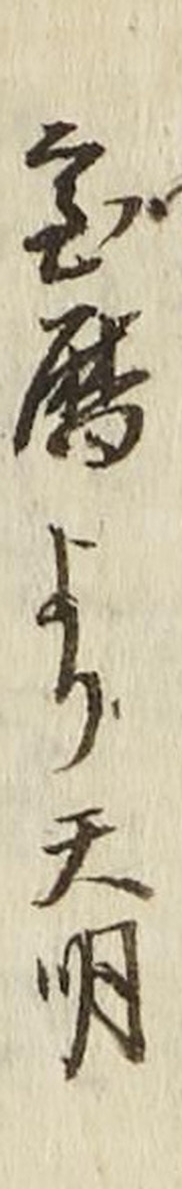宝暦より天明
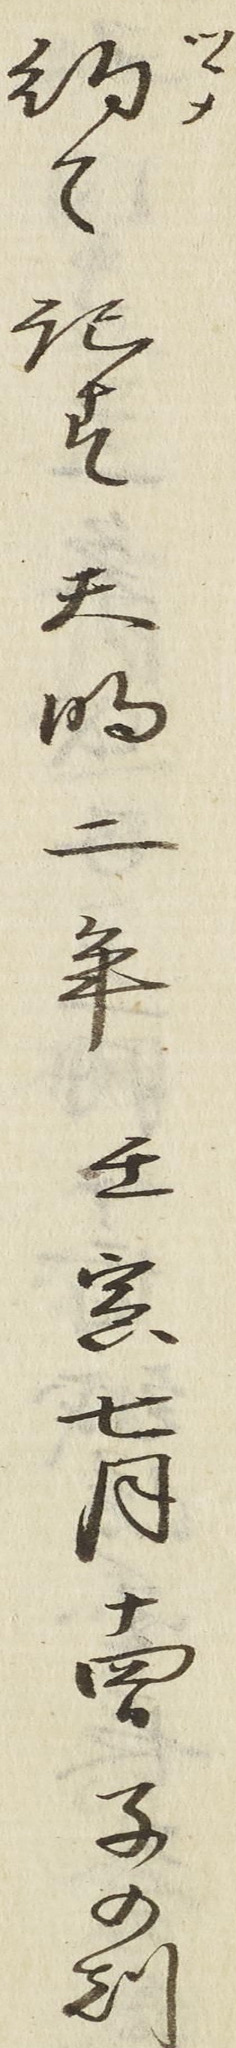約て記す天明二年壬寅七月十四日子の刻
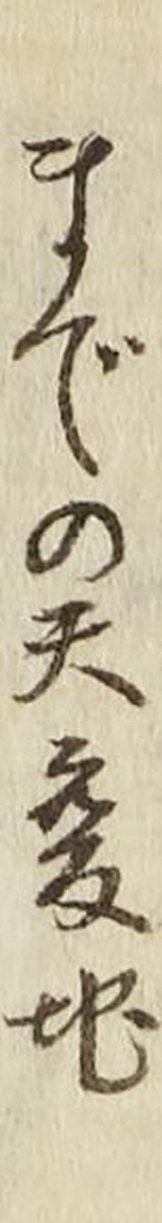までの天変地
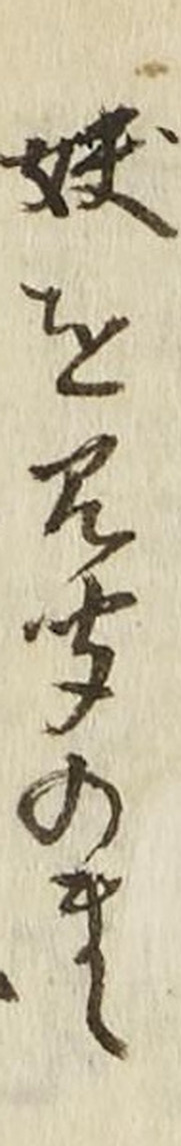妖を見聞のまゝ
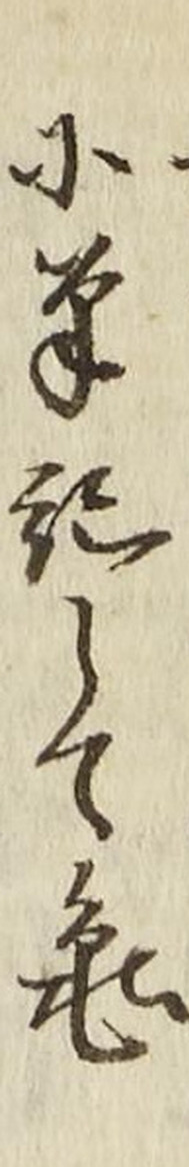に筆記して亀
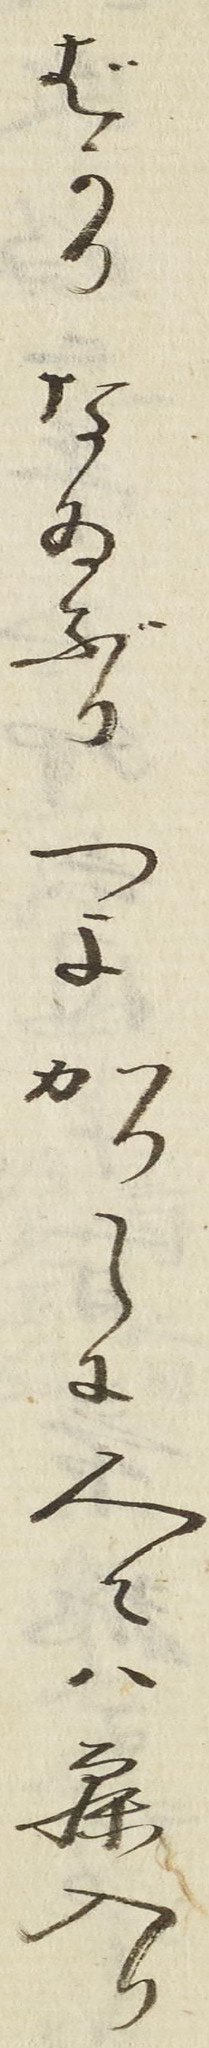ばかりなゐぶりつよかりしに人〻は寝入り
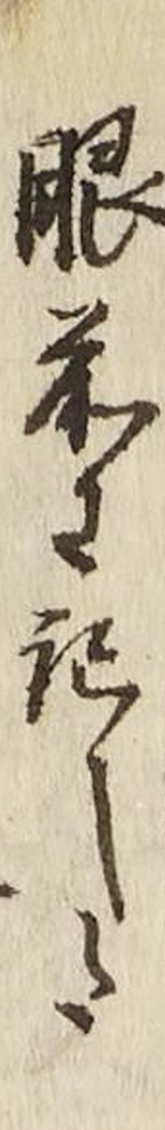眼前に記したる
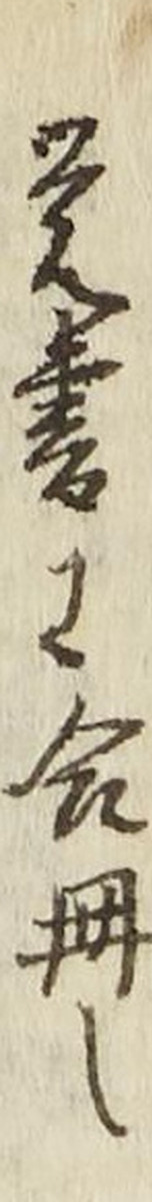覚書に合冊し
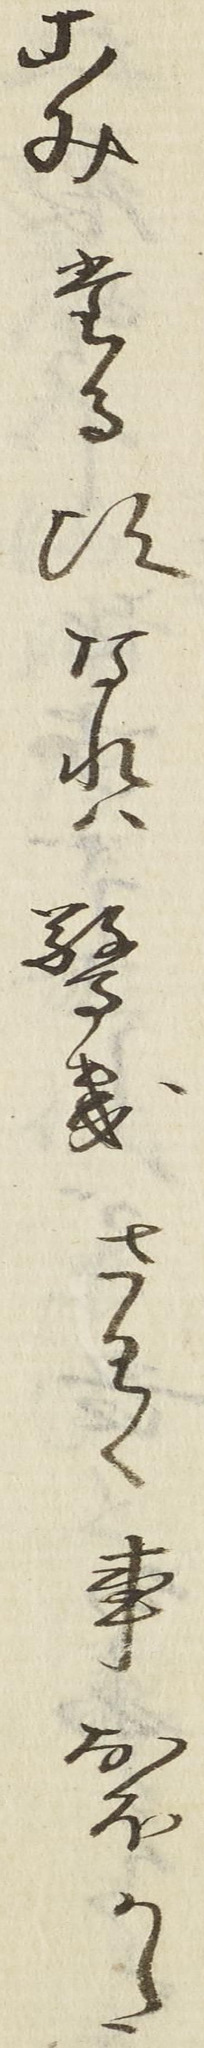こみたる頃なれは驚きさはく事おほかた
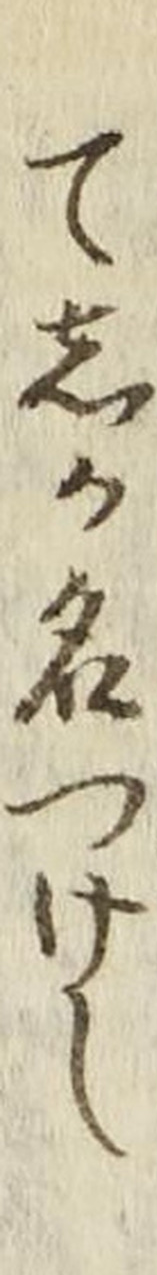てしか名つけし
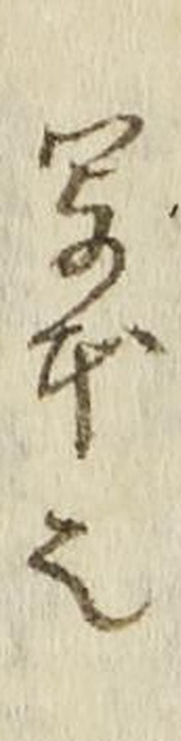写本也
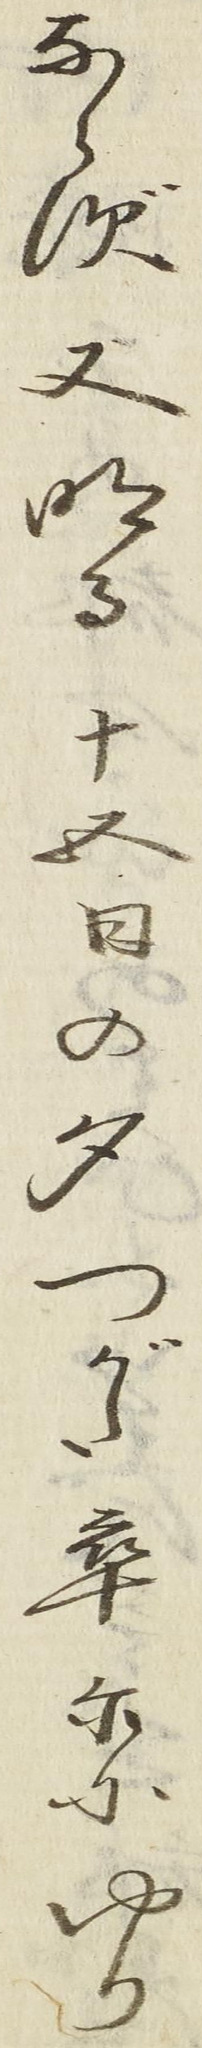ならず又明る十五日の夕つがた卒爾にゆり
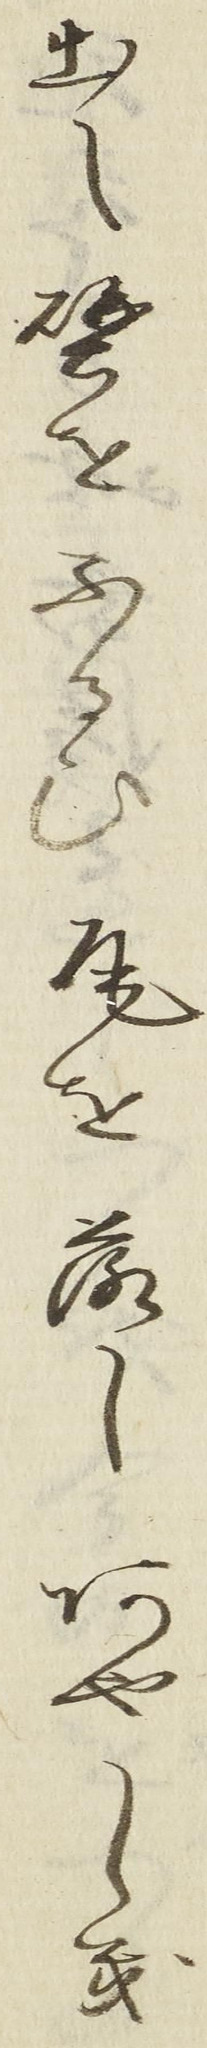出し壁をふるひ瓦を落しあやしき
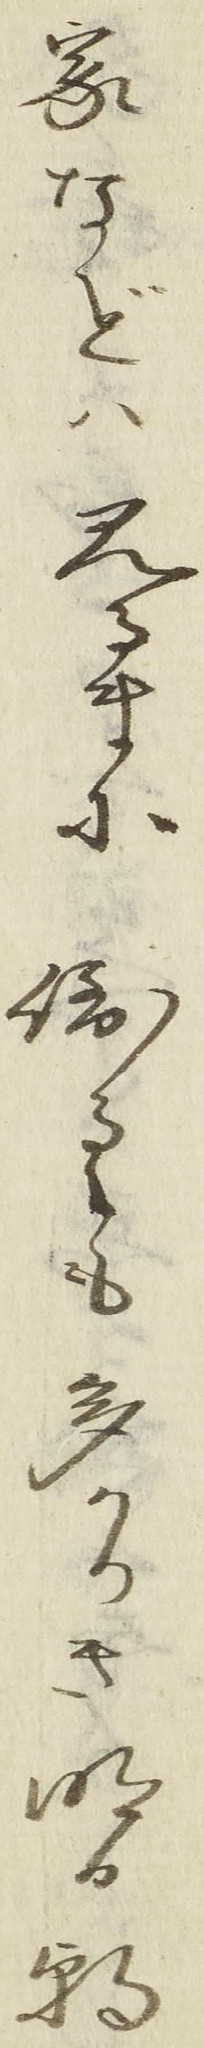家などは見るまに倒るゝも多かりき明る朝
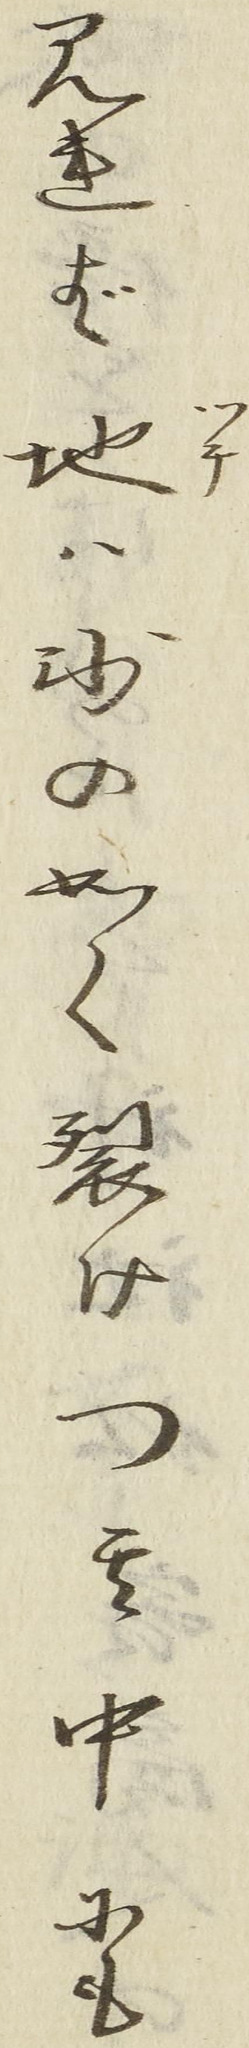見れば地は氷の如く裂けつ其中にも
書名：やぶれ窓の記　全
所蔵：東京大学地震研究所図書室 Earthquake Research Institute Library, The University of Tokyo, JAPAN
